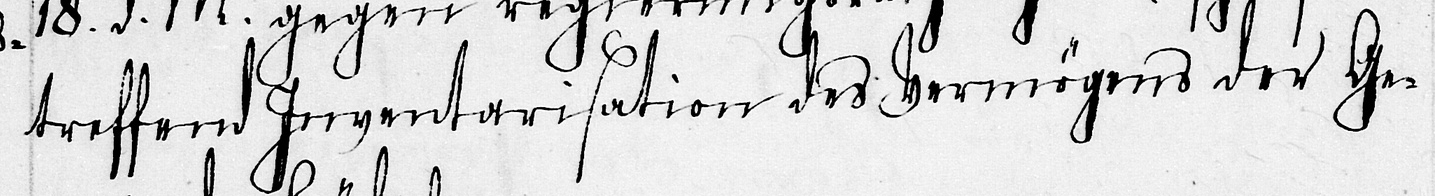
treffend Inventarisation des Vermögens der Ge¬
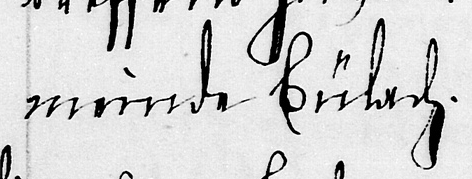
meinde Bülach.
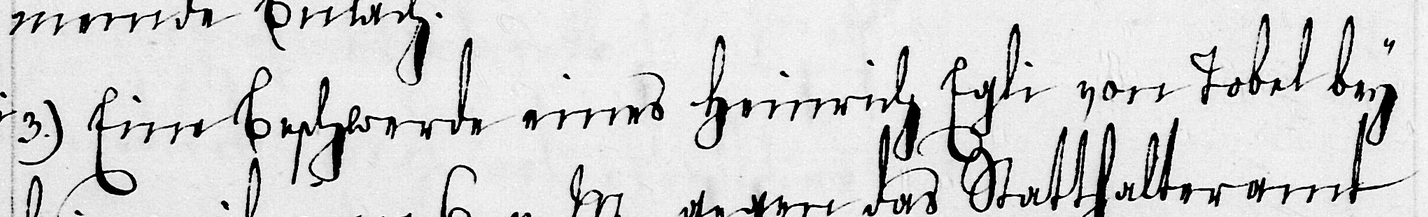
3.) Eine Beschwerde eines Heinrich Egli von Tobel bey
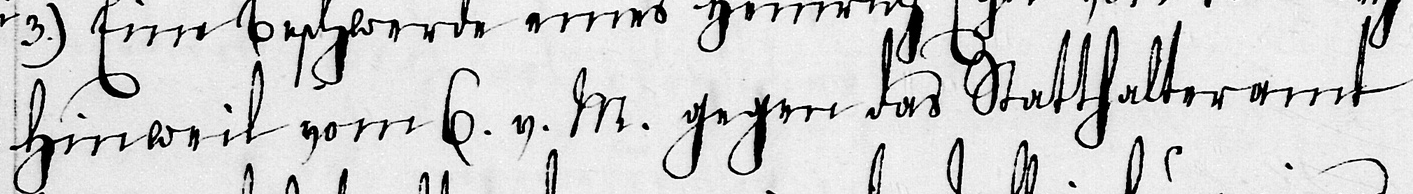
Hinweil vom 6. v. M. gegen das Statthalteramt
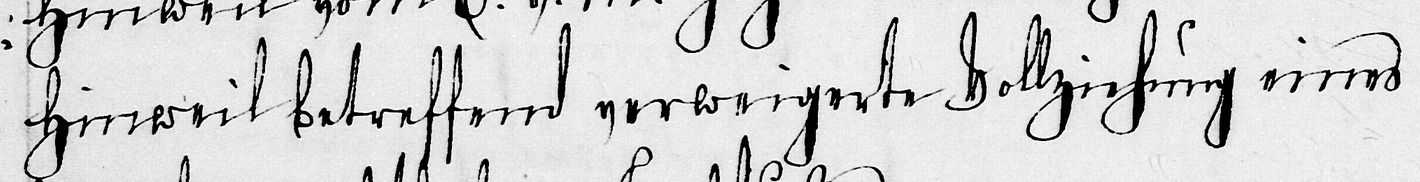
Hinweil betreffend verweigerte Vollziehung eines
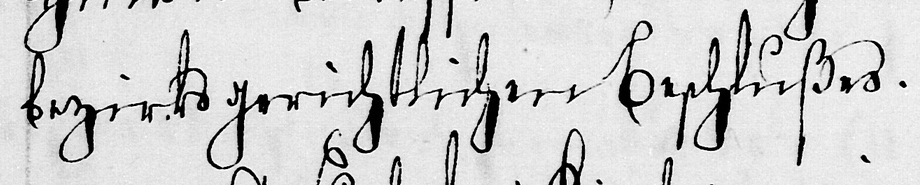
bezirksgerichtlichen Beschlußes.
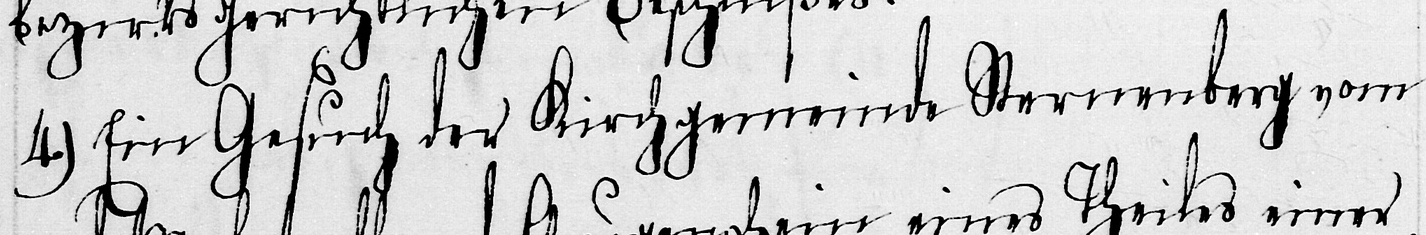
4.) Ein Gesuch der Kirchgemeinde Sternenberg vom
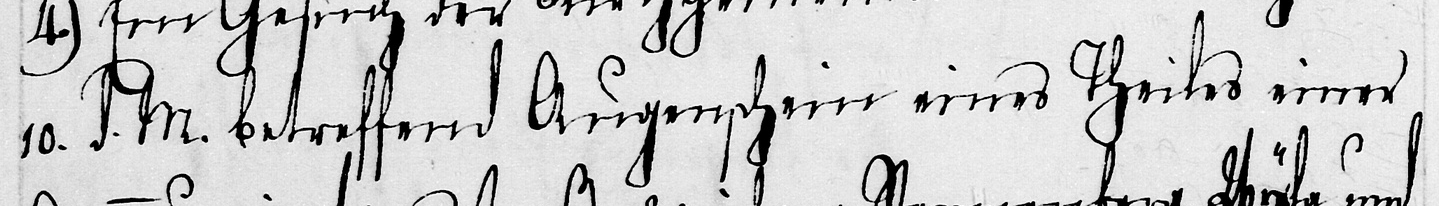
10. d. M. betreffend Augenschein eines Theiles einer
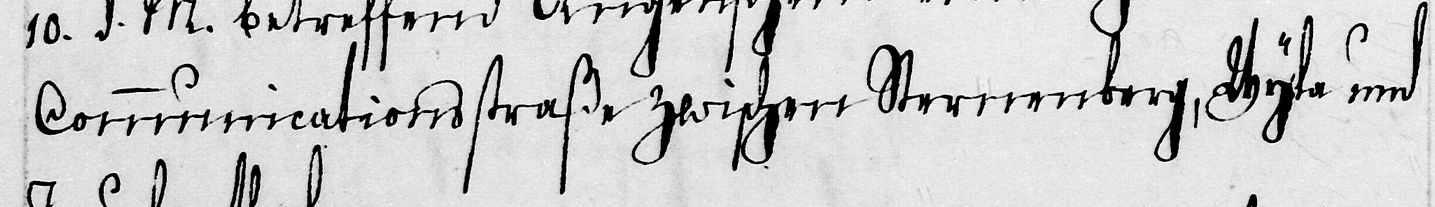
Communicationsstraße zwischen Sternenberg, Wyla und
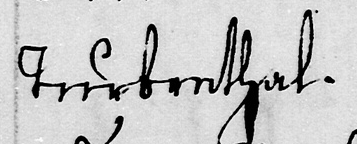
Turbenthal.
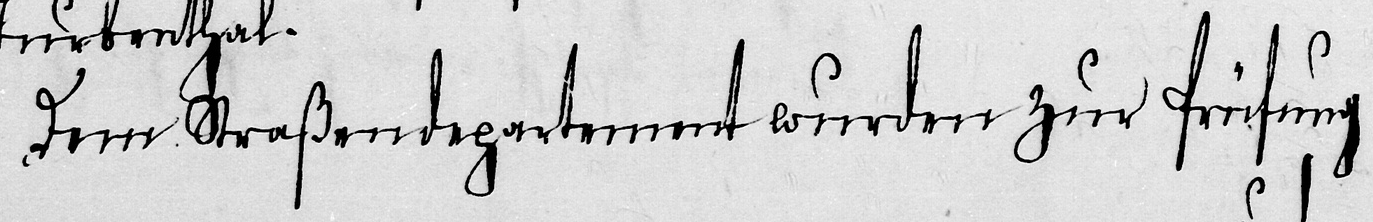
Dem Straßendepartement wurden zur Prüfung
